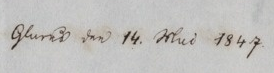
Glarus den 14. Mai 1847.
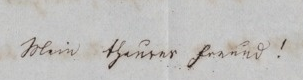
Mein theurer Freund!
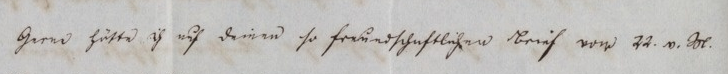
Gerne hätte ich auf deinen so freundschaftlichen Brief vom 22. v. M.
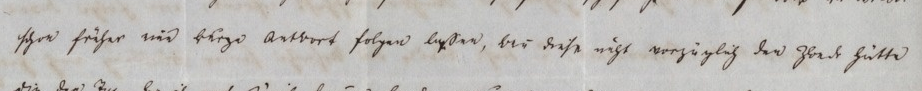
schon früher eine kurze Antwort folgen lassen, wenn diese nicht vorzüglich den Zweck hätte
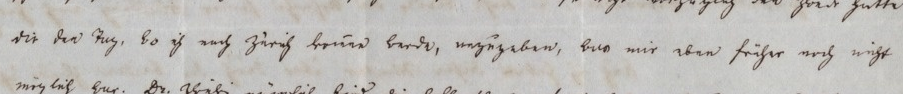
dir den Tag, wo ich nach Zürich kommen werde, anzugeben, was mir eben früher noch nicht
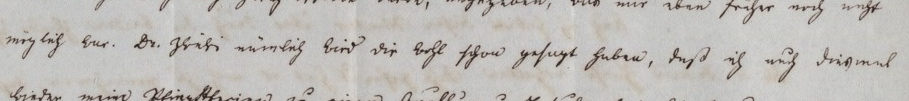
möglich war. Dr. Zwicki nämlich wird dir wohl schon gesagt haben, daß ich auch diesmal
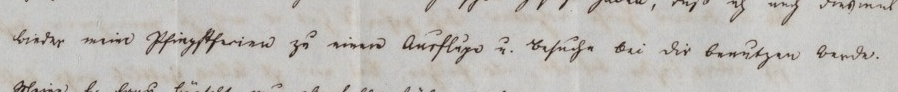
wieder meine Pfingstferien zu einem Ausfluge u. Besuche bei dir benutzen werde.
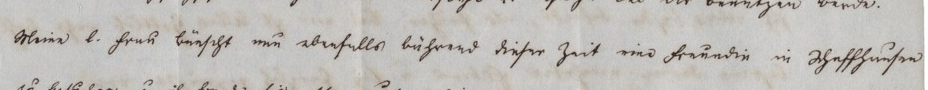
Meine l. Frau wünscht nun ebenfalls während dieser Zeit eine Freundin in Schaffhausen
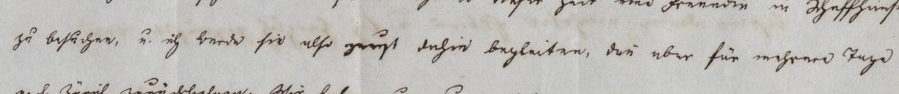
zu besuchen, u. ich werde sie also zuerst dahin begleiten, dann aber für mehrere Tage
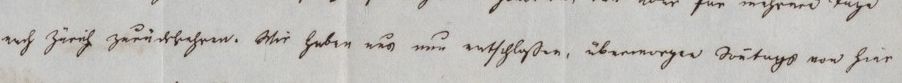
nach Zürich zurückkehren. Wir haben uns nun entschlossen, übermorgen Sonntags von hier
